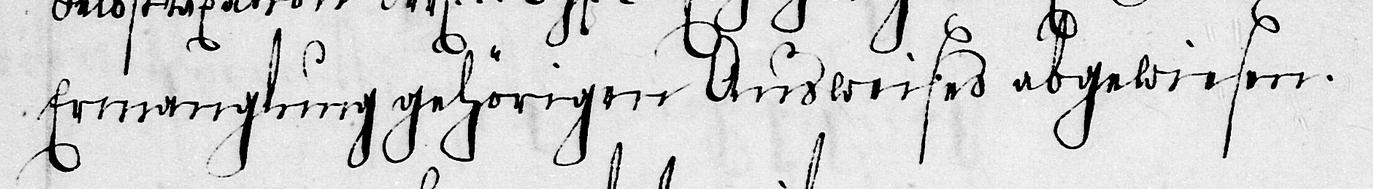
Ermanglung gehörigen Ausweises abgewiesen.
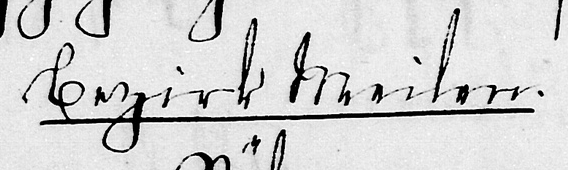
Bezirk Meilen.
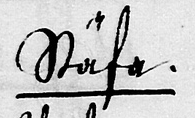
Stäfa.
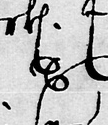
P¬
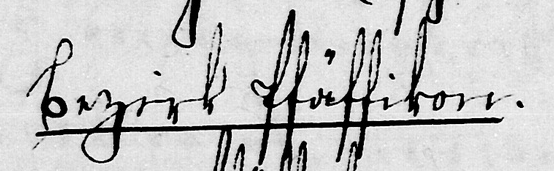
Bezirk Pfäffikon.
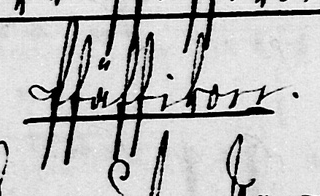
fäffiko¬
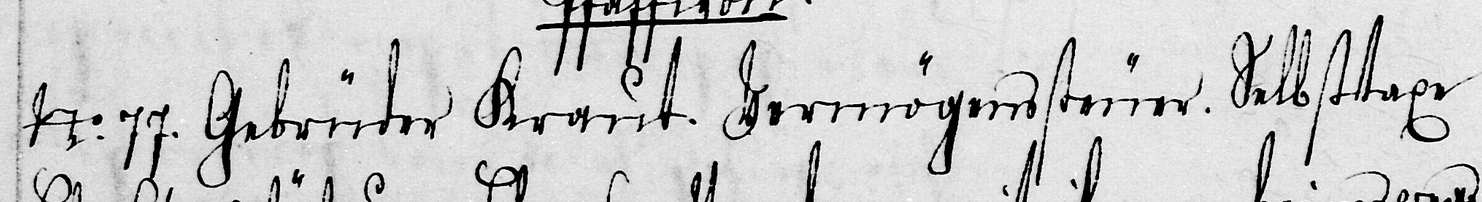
No. 77. Gebrüder Kraut. Vermögenssteuer. Selbsttaxe
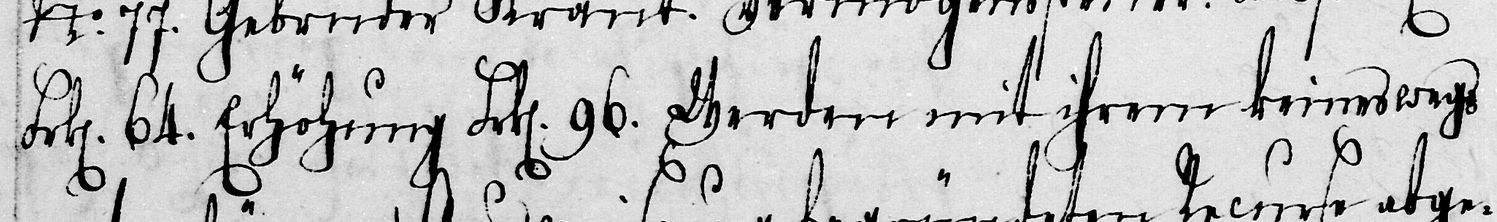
Erhöhung Frk[en]. 96. Werden mit ihrem keineswegs
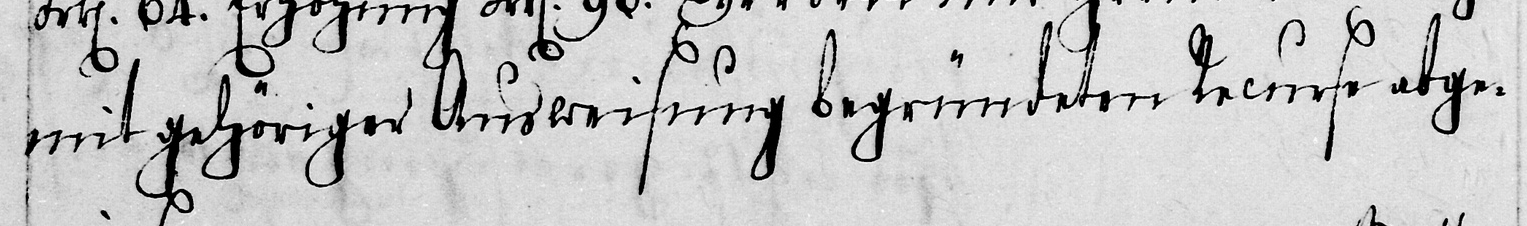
mit gehöriger Ausweisung begründeten Recurse abge¬
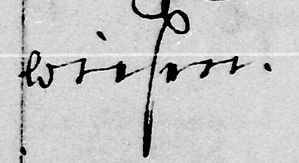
wiesen.
